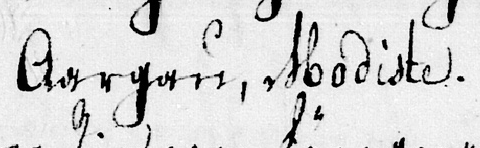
Aargau, Modiste.
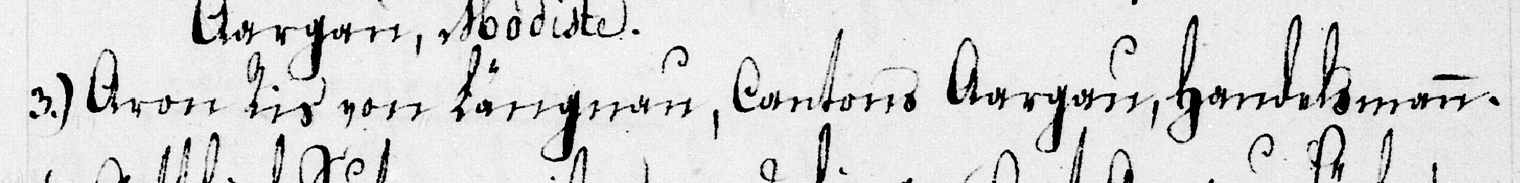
3.) Aron Ris von Längnau, Cantons Aargau, Handelsmann.
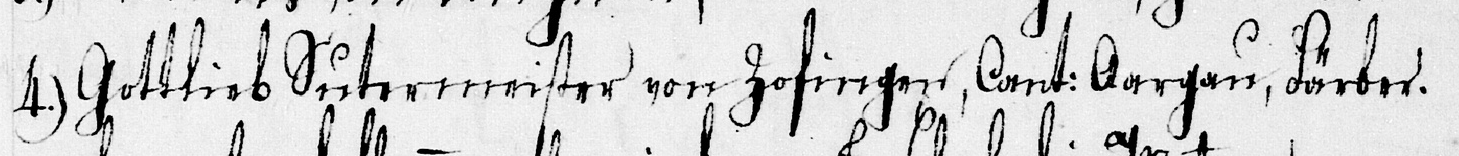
4.) Gottlieb Sutermeister von Zofingen, Cant: Aargau, Färber.
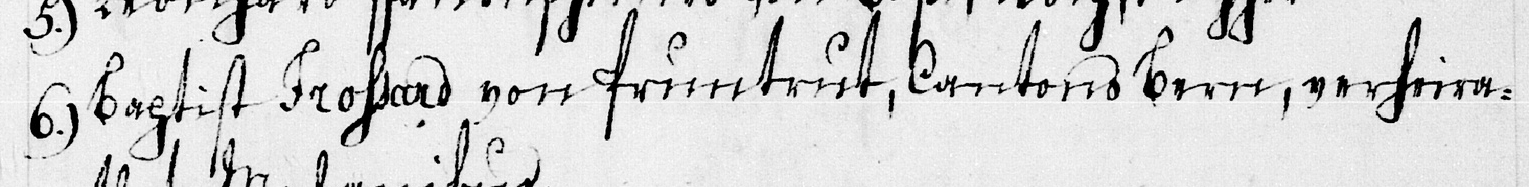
6.) Baptist Frosscard von Pruntrut, Cantons Bern, verheira¬
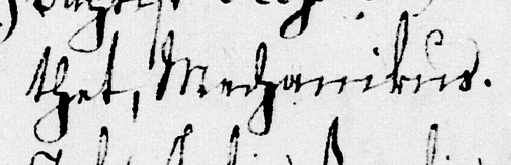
thet, Mechanikus.
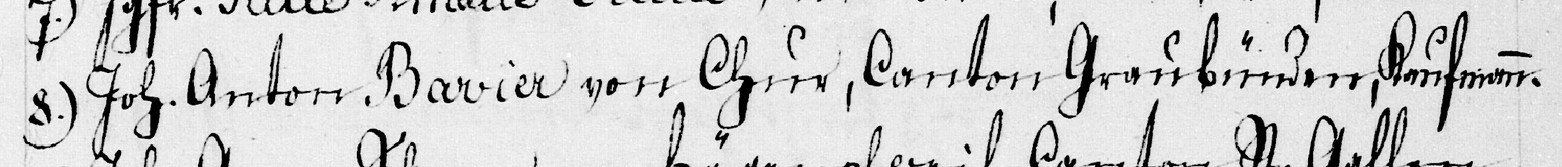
8.) Joh. Anton Bavier von Chur, Canton Graubünden, Kaufmann.
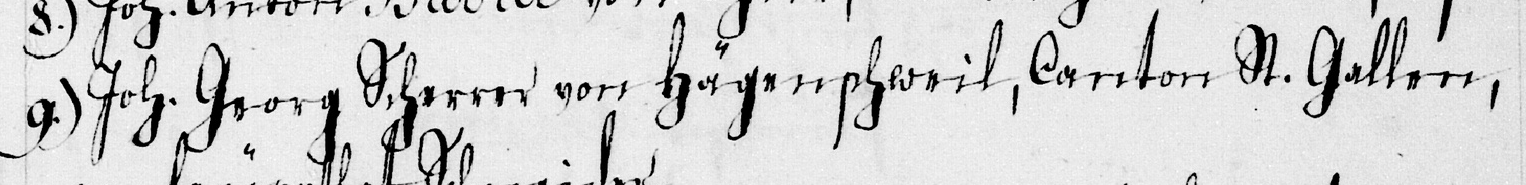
9.) Joh. Georg Scherrer von Hägenschweil, Canton St. Gallen,
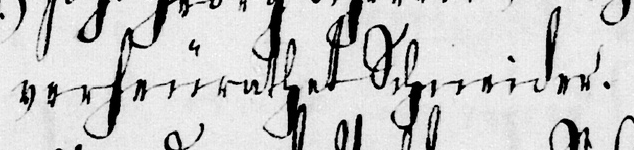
verheurathet Schneider.
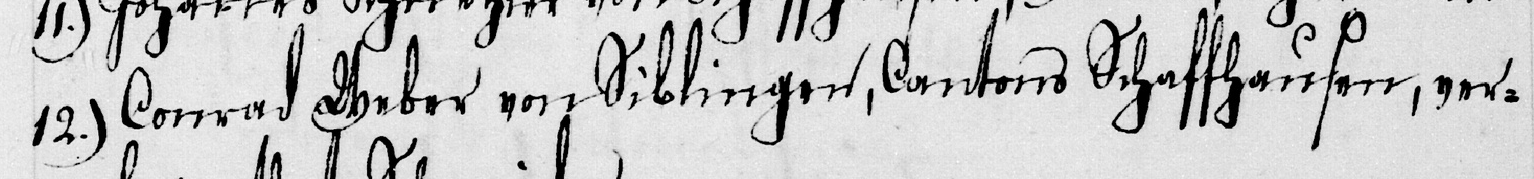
12.) Conrad Weber von Siblingen, Cantons Schaffhausen, ver¬
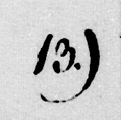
11.)
